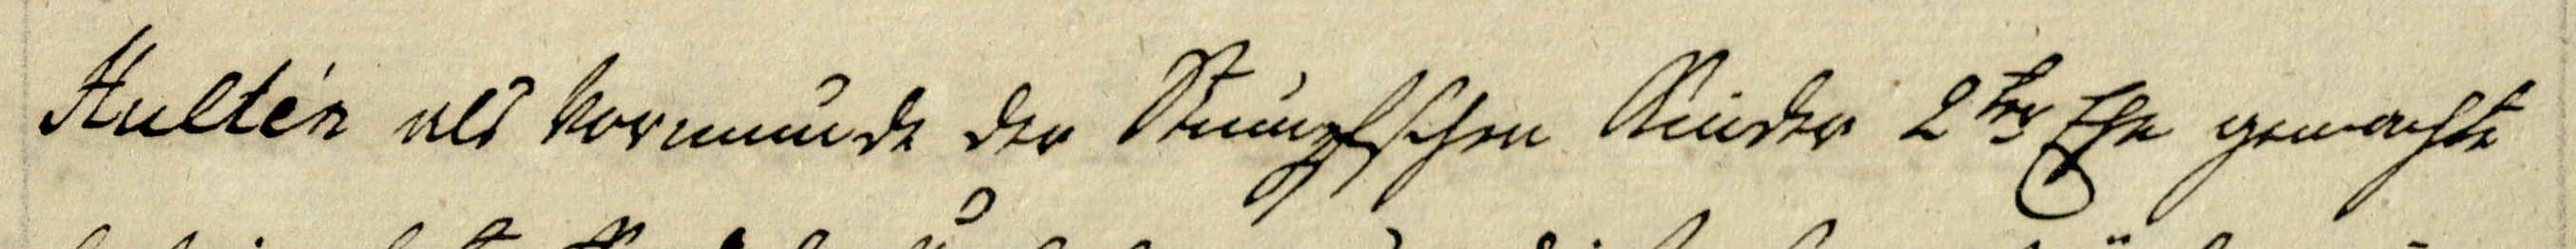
Hultén als Vormunde der Stumpfschen Kinder 2 ter Ehe gemachte
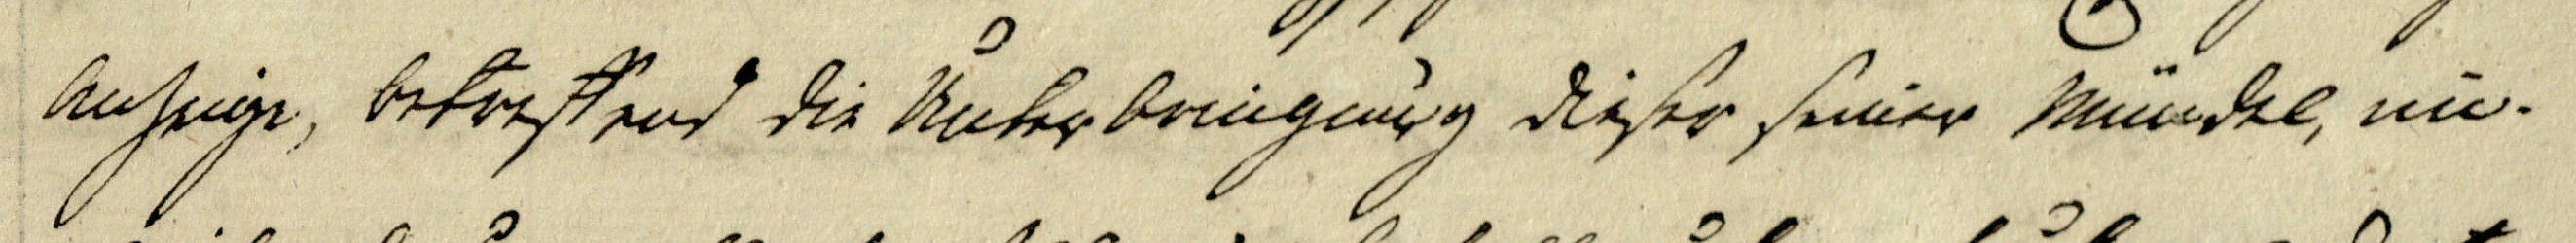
Anzeige, betreffend die Unterbringung dieser seiner Mündel, im¬
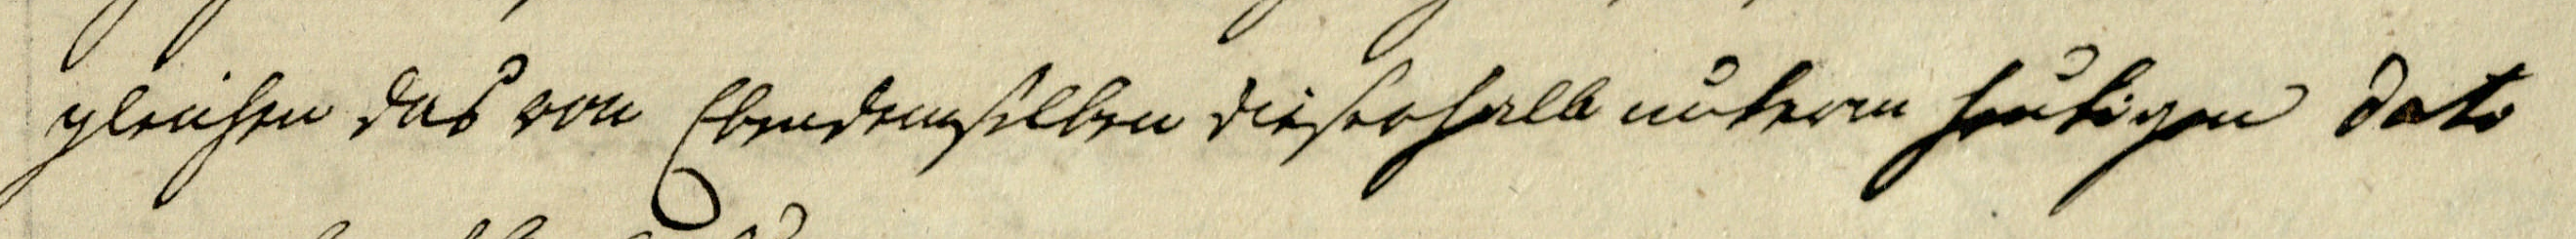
gleichen das von Ebendemselben dieserhalb unterm heutigen dato
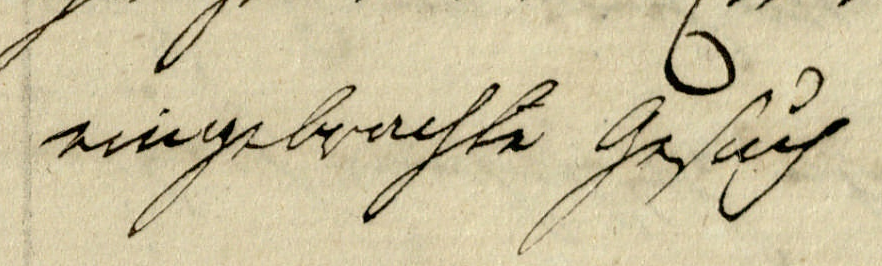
eingebrachte Gesuch
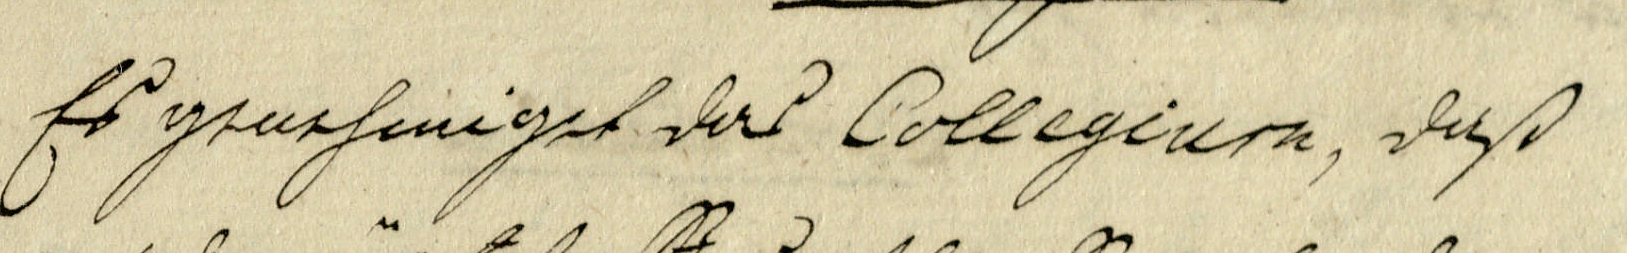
Es genehmiget das Collegium, daß
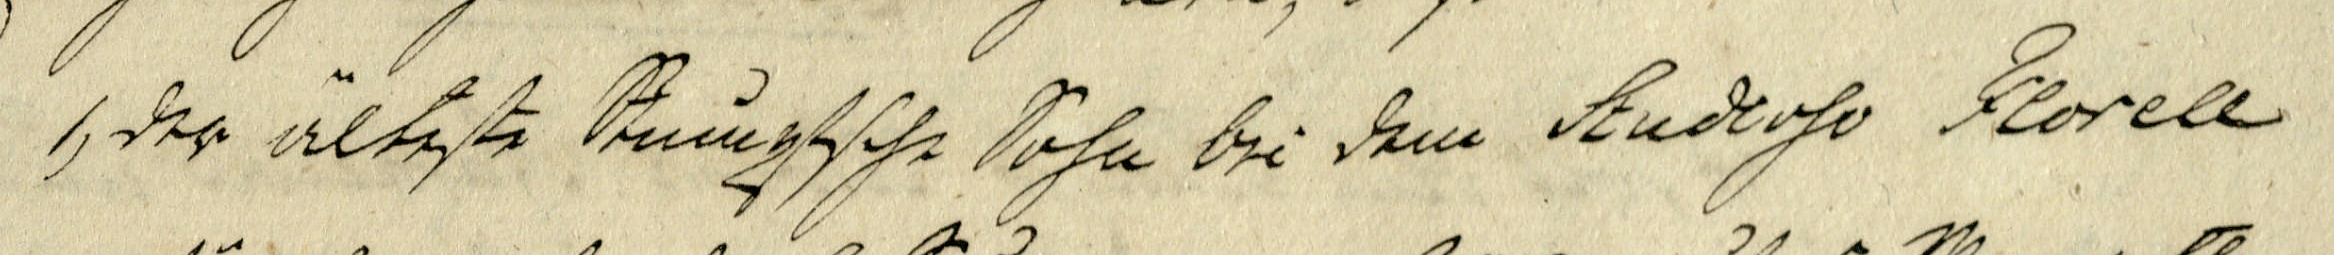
1, der älteste Stumpfsche Sohn bei dem Studioso Florell
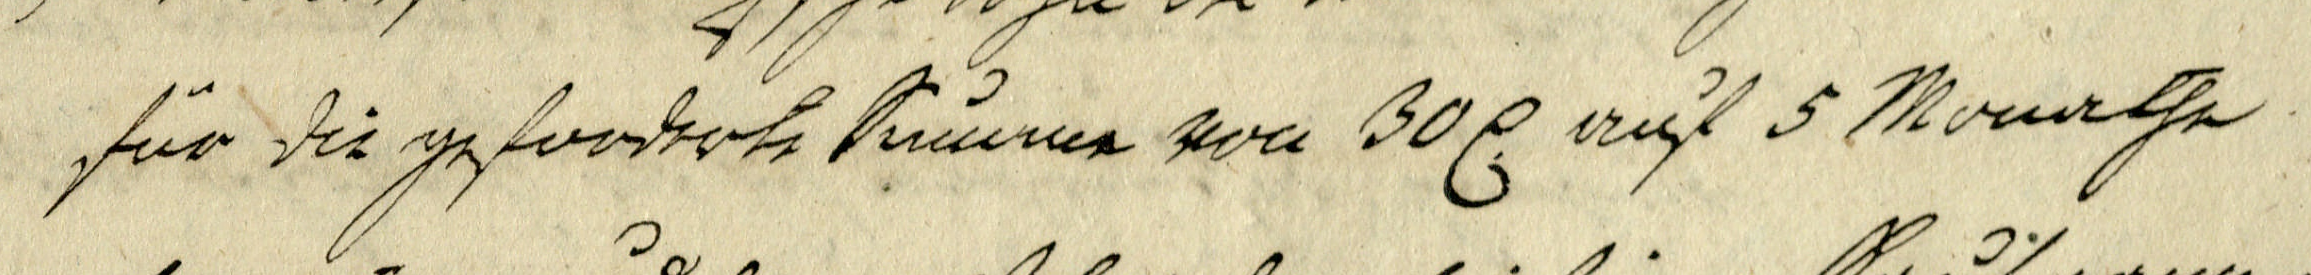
für die geforderte Summe von 30 l. auf 5 Monathe
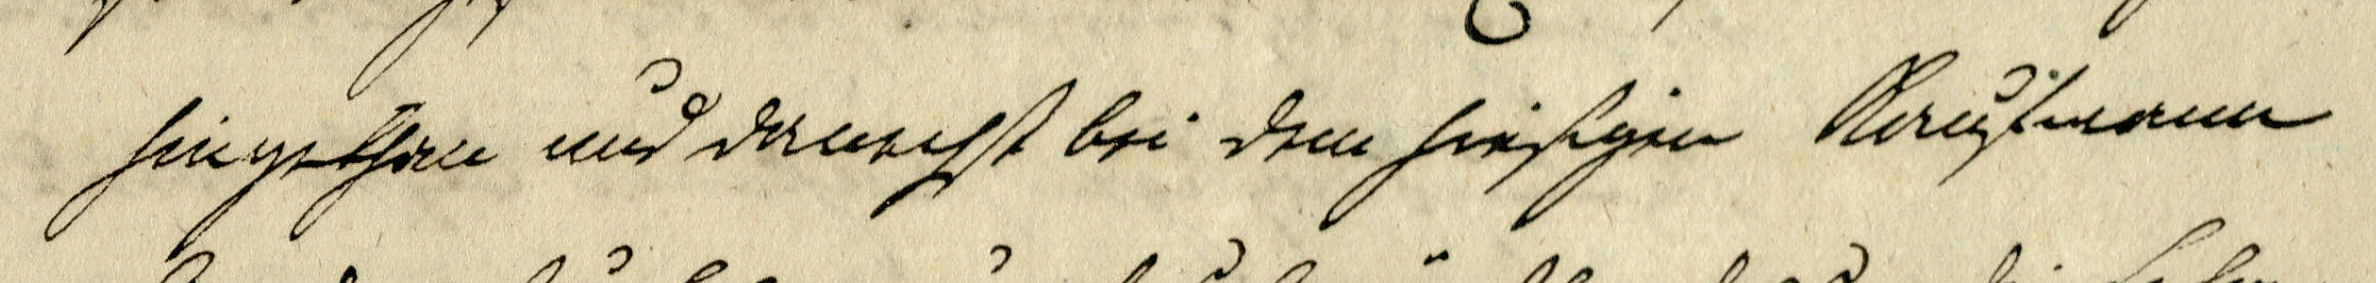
hingethan und danechst bei dem hiesigen Kaufmann
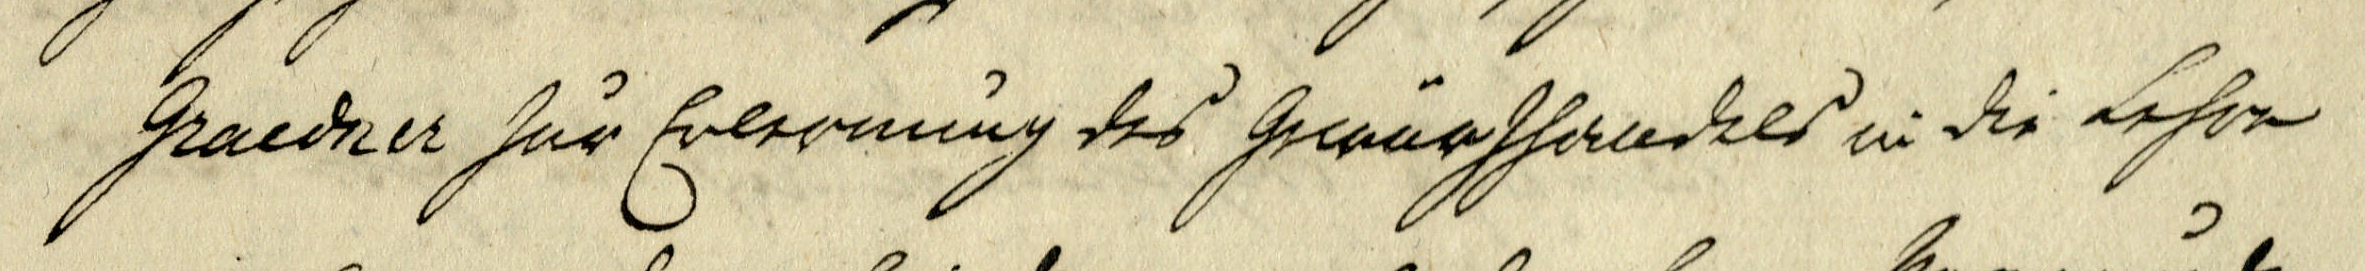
Graedner zur Erlernung des Gewürzhandels in die Lehre
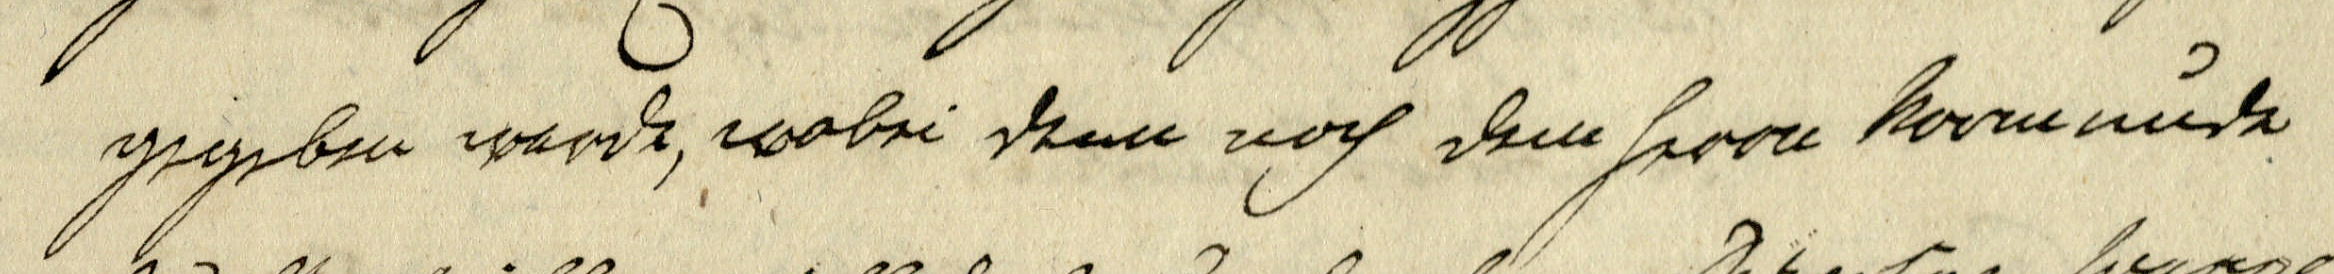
gegeben werde, wobei denn noch dem Herrn Vormunde
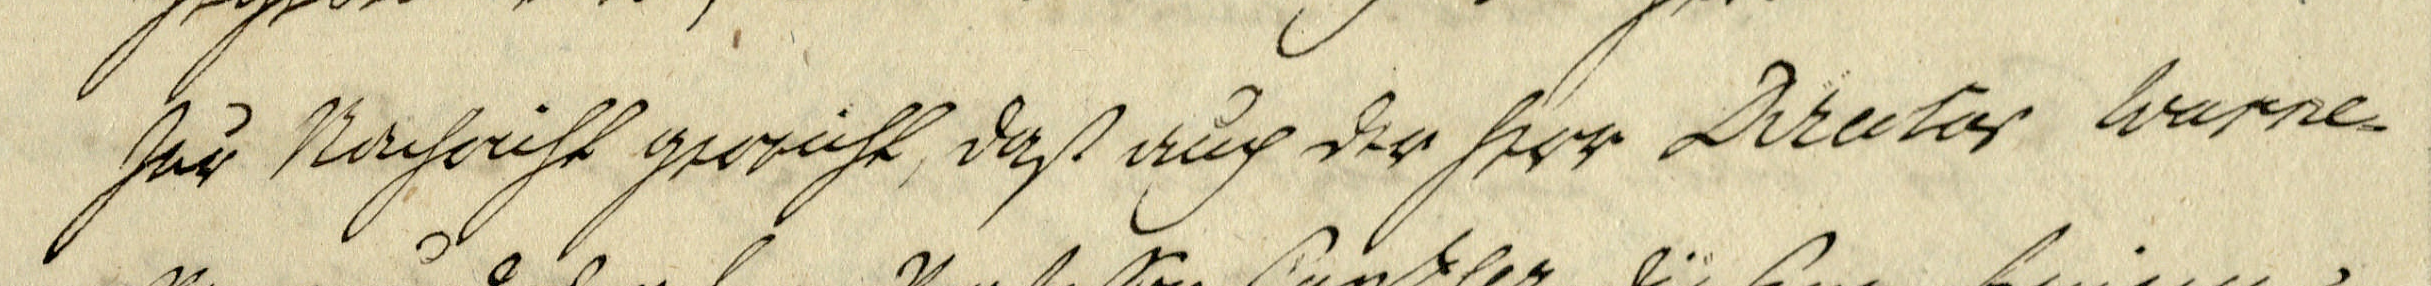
zur Nachricht gereicht, daß auch der Herr Director Warne¬
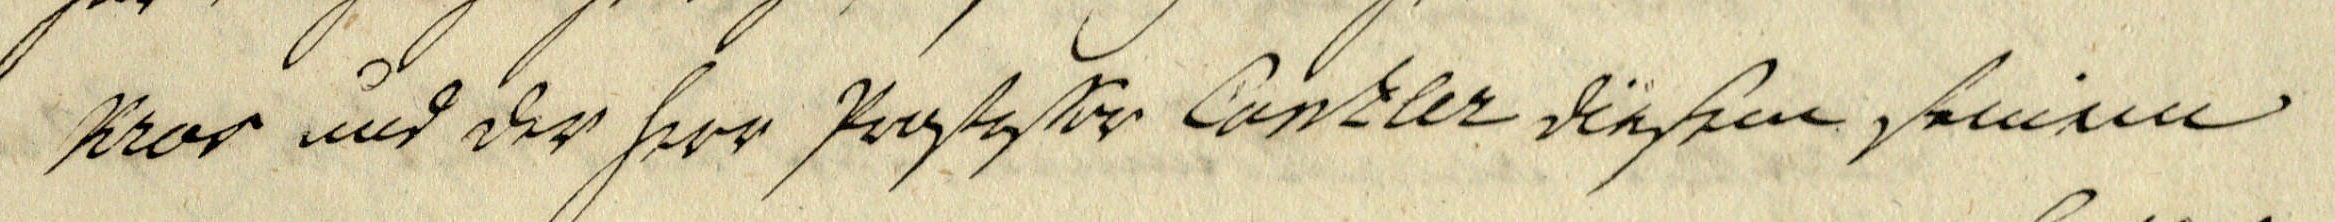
kros und der Herr Professor Canzler diesem seinem
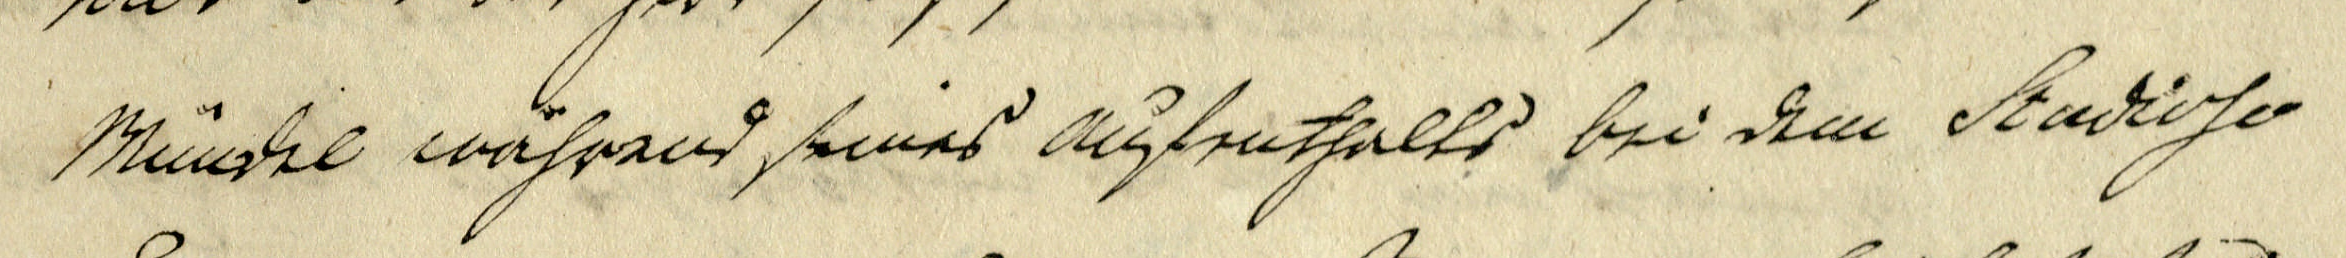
Mündel während seines Aufenthalts bei dem Studioso
